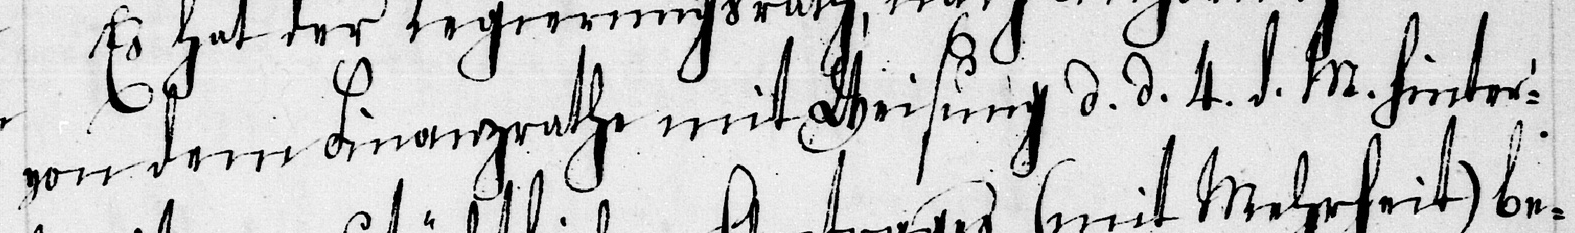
von dem Finanzrathe mit Weisung d. d. 4. d. M. hinter¬
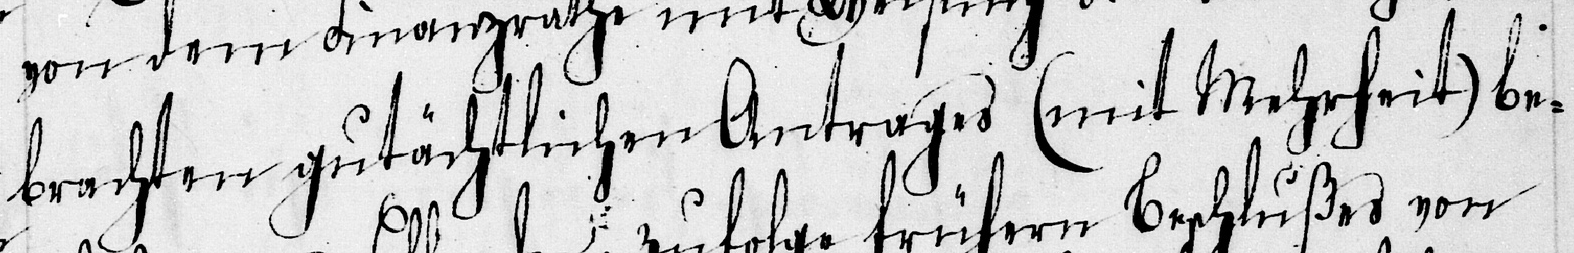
brachten gutächtlichen Antrages (mit Mehrheit) be¬
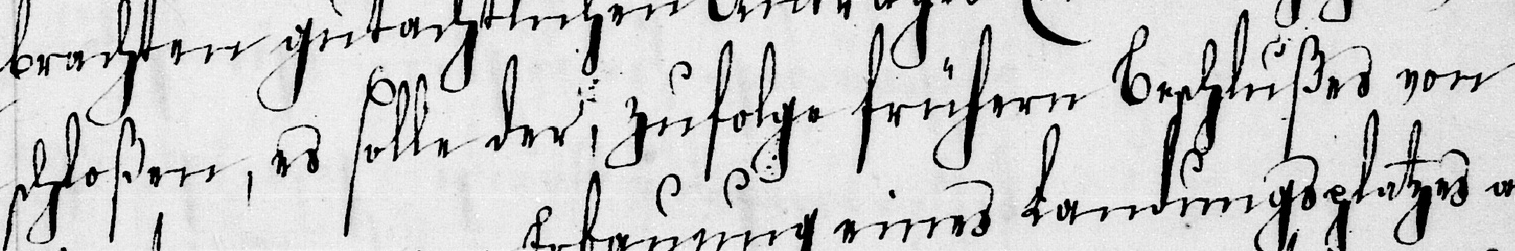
chloßen, es solle der, zufolge frühern Beschlußes von
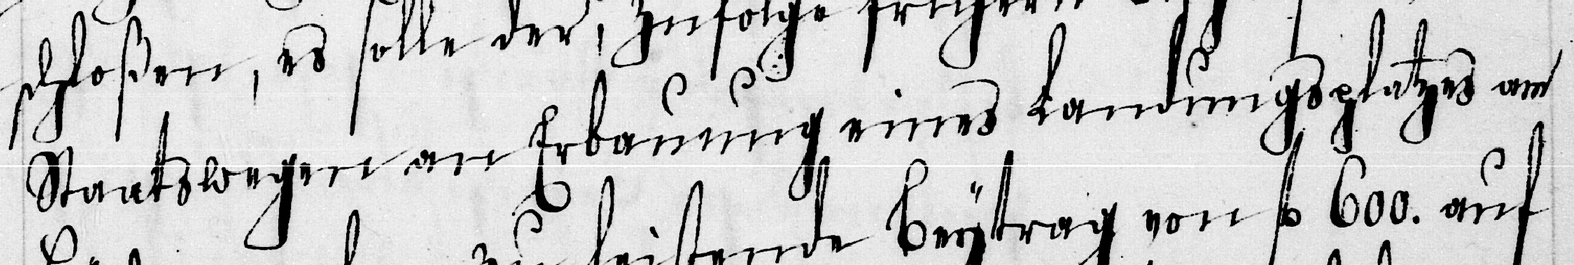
Staatswegen an Erbauung eines Landungsplatzes am
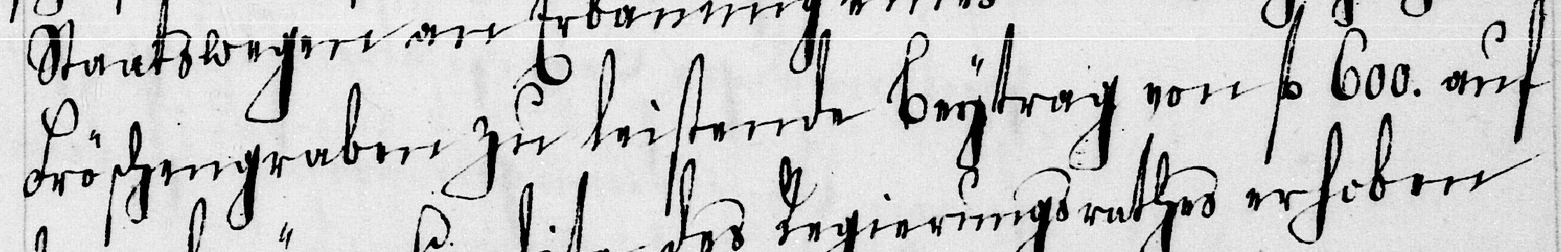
Fröschengraben zu leistenden Beytrag von fl. 600. auf
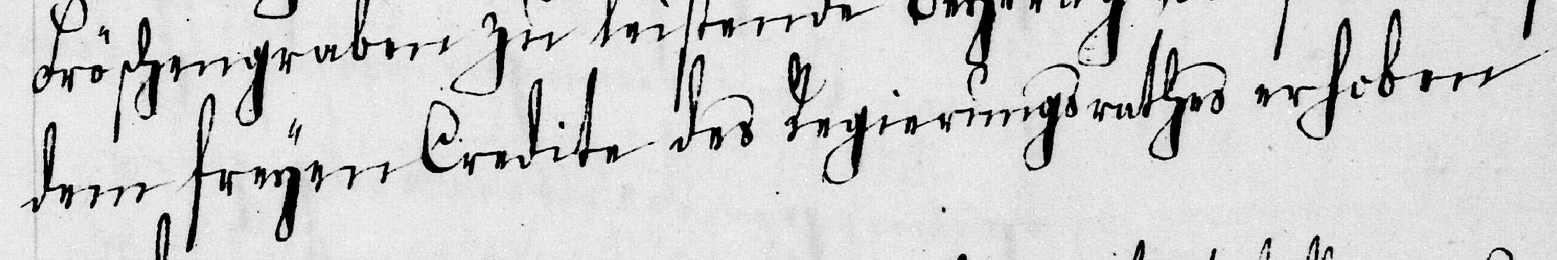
dem freyen Credite des Regierungsrathes erhoben
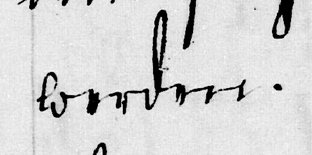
werden.
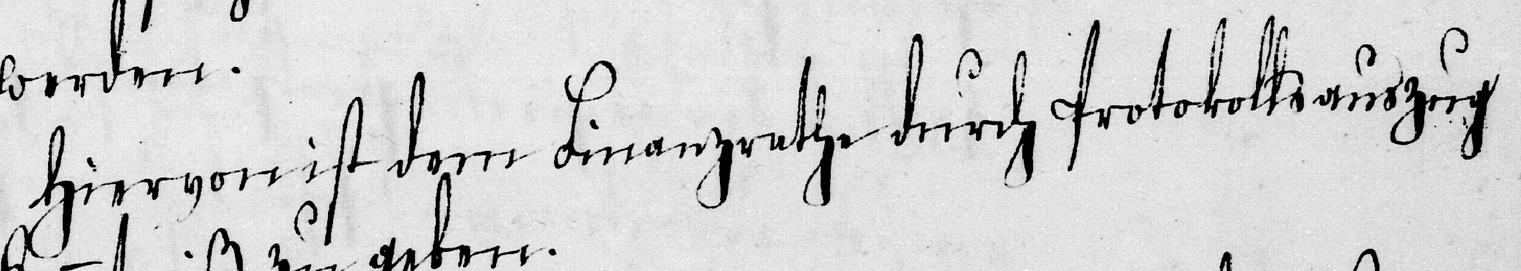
Hiervon ist dem Finanzrathe durch Protokollsauszug
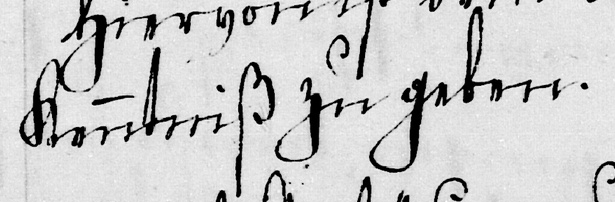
Kenntniß zu geben.
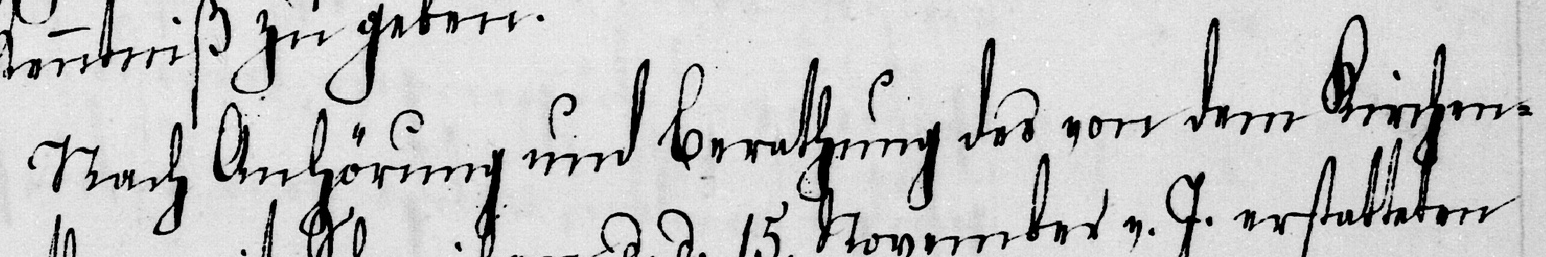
Nach Anhörung und Berathung des von dem Kirchen¬
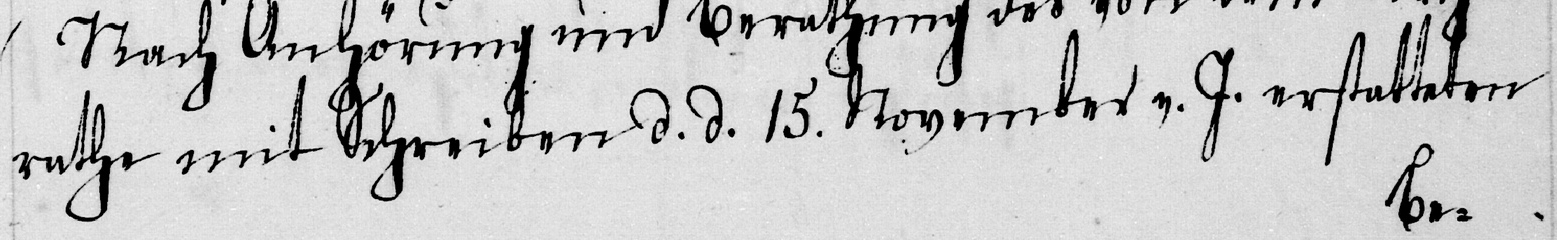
rathe mit Schreiben d. d. 15. November v. J. erstatteten
